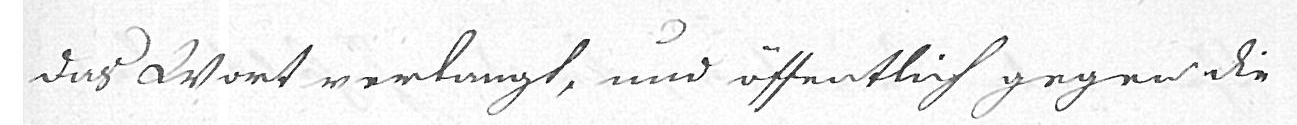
das Wort verlangt, und öffentlich gegen die
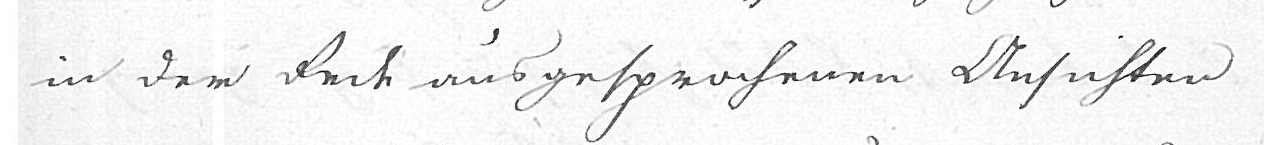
in der Rede ausgesprochenen Ansichten
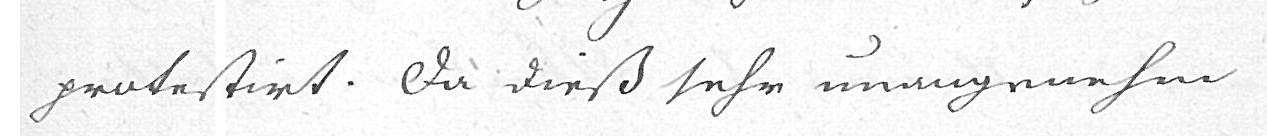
protestirt. Da dieß sehr unangenehm
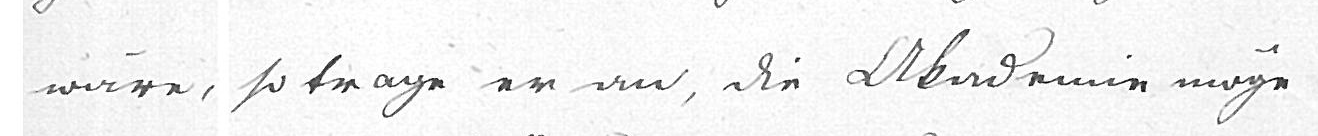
wäre, so trage er an, die Akademie möge
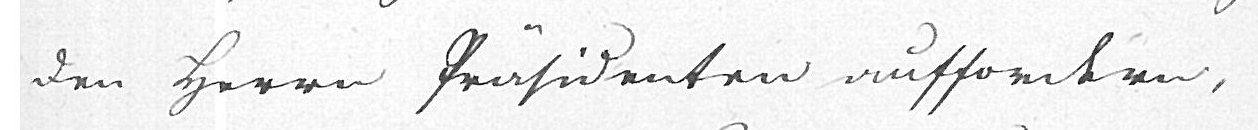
den Herrn Präsidenten auffordern,
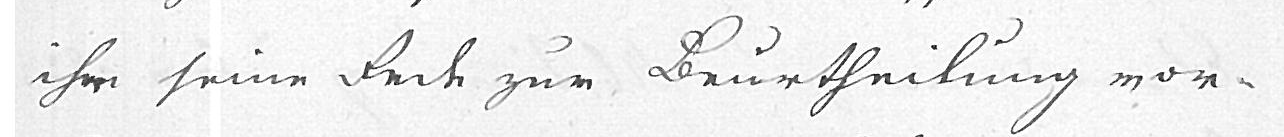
ihr seine Rede zur Beurtheilung vor-
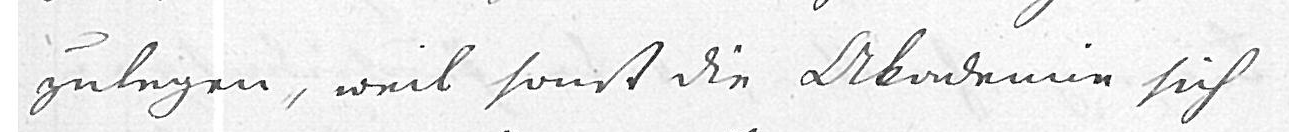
zulegen, weil sonst die Akademie sich
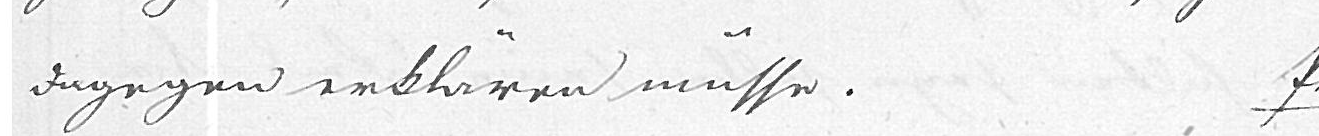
dagegen erklären müsse.
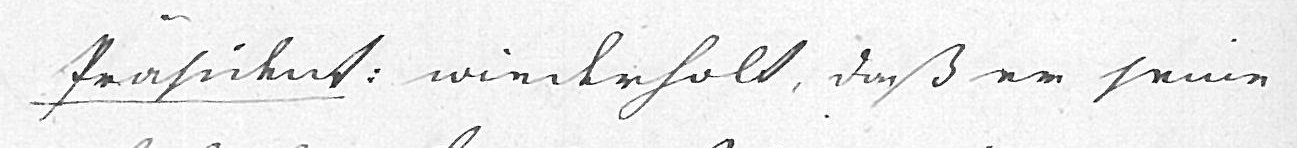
Präsident: wiederholt, daß er seine
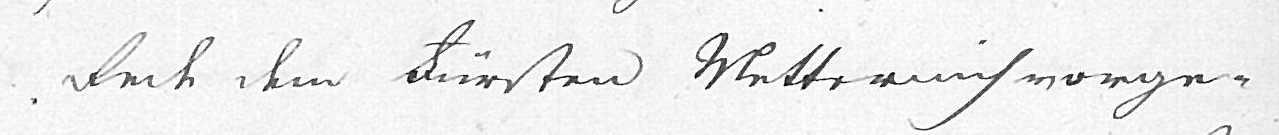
Rede dem Fürsten Metternich vorge-
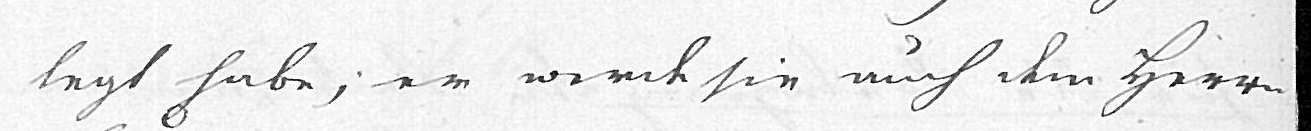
legt habe; er werde sie auch dem Herrn
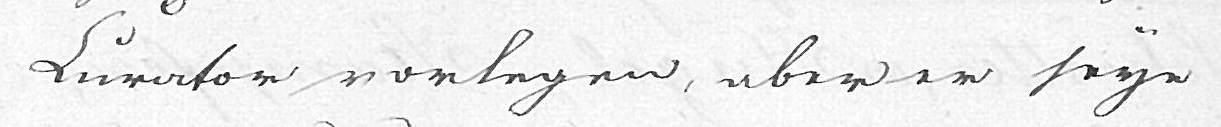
Curator vorlegen, aber er seye
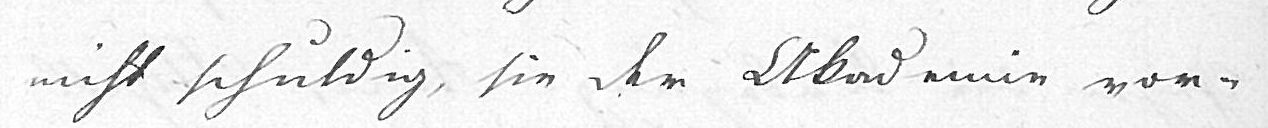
nicht schuldig, sie der Akademie vor-
